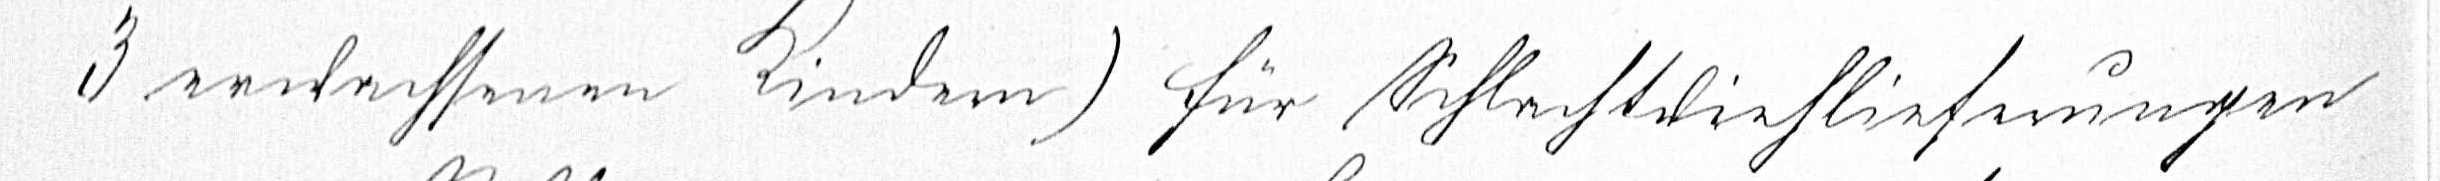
erwachsenen Kindern) für Schachtviehlieferungen
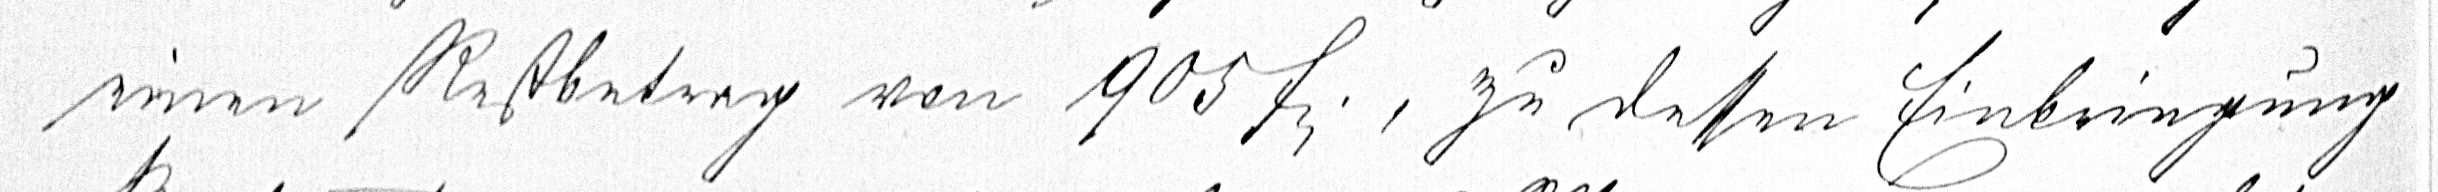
einen Restbetrag von 905f., zu dessen Einbringung
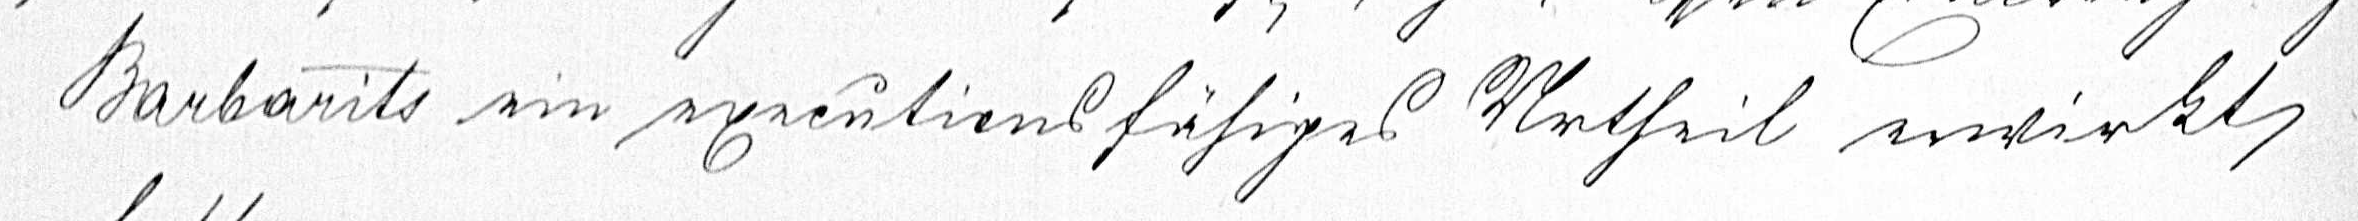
Barbarits ein executionsfähiges Urtheil erwirkt
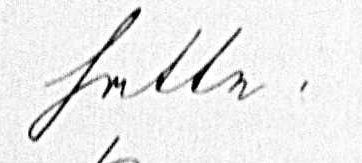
hatte.
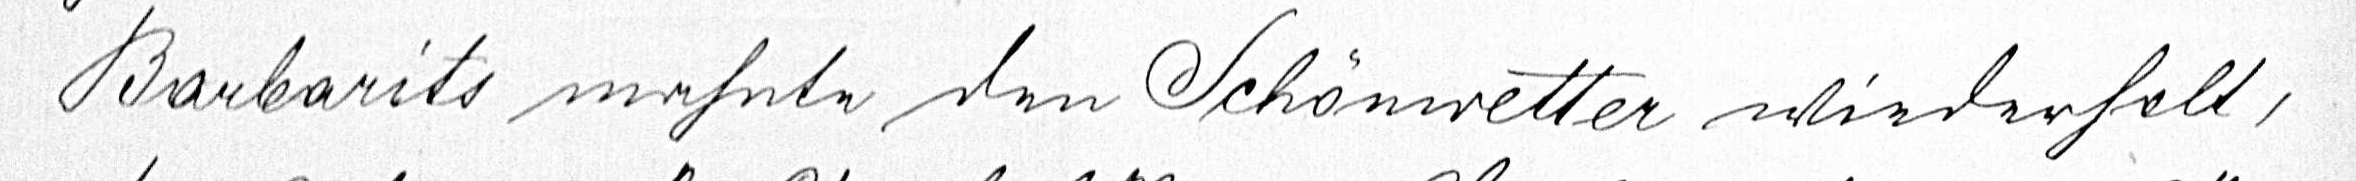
Barbarits mahnte den Schönwetter wiederholt,
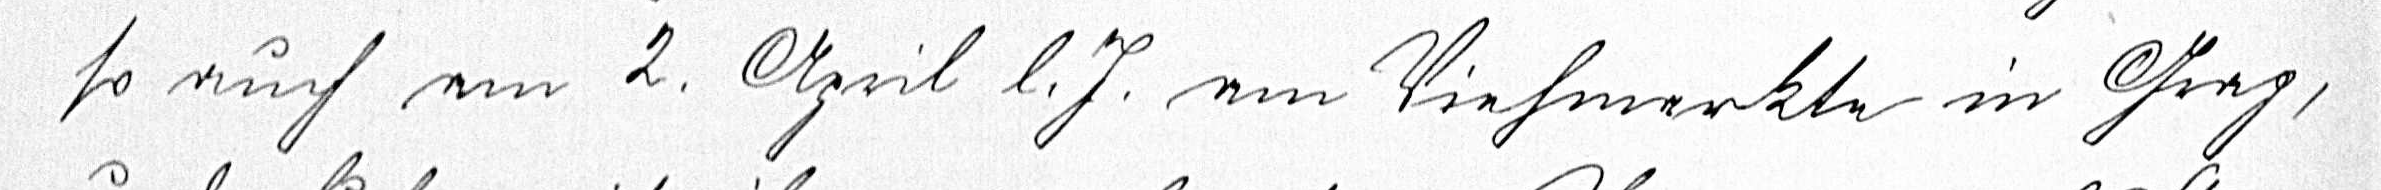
so auch am 2. April l. J. am Viehmarkte in Graz
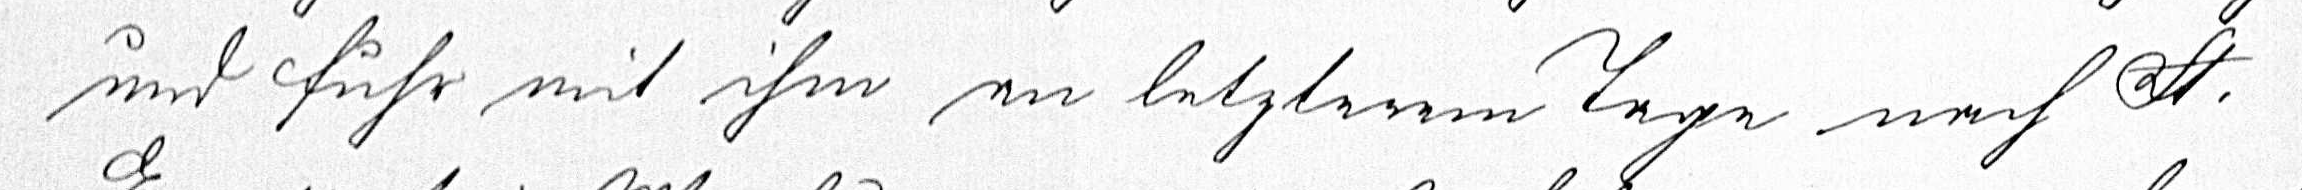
und fuhr mit ihm an letzteren Tage nach St.
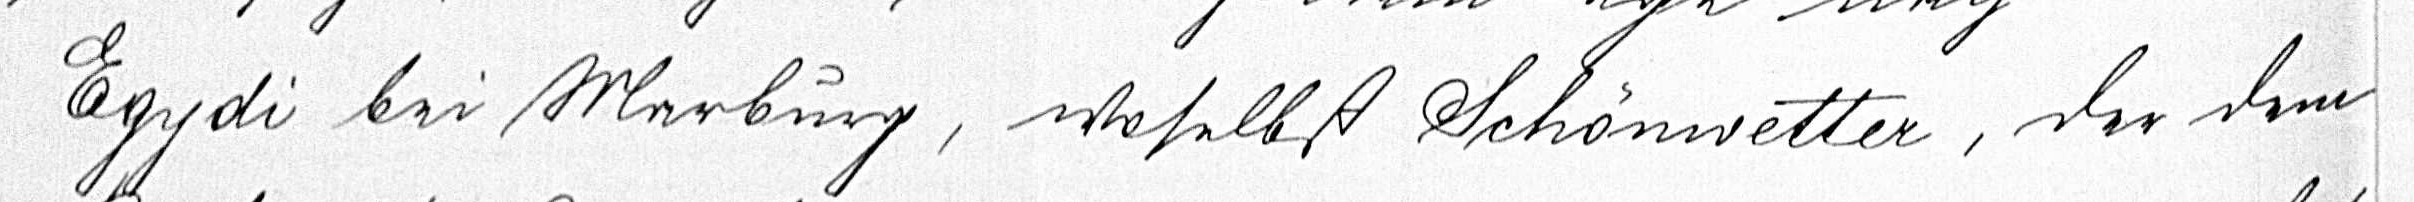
Egydi bei Marburg, woselbst Schönwetter, der dem
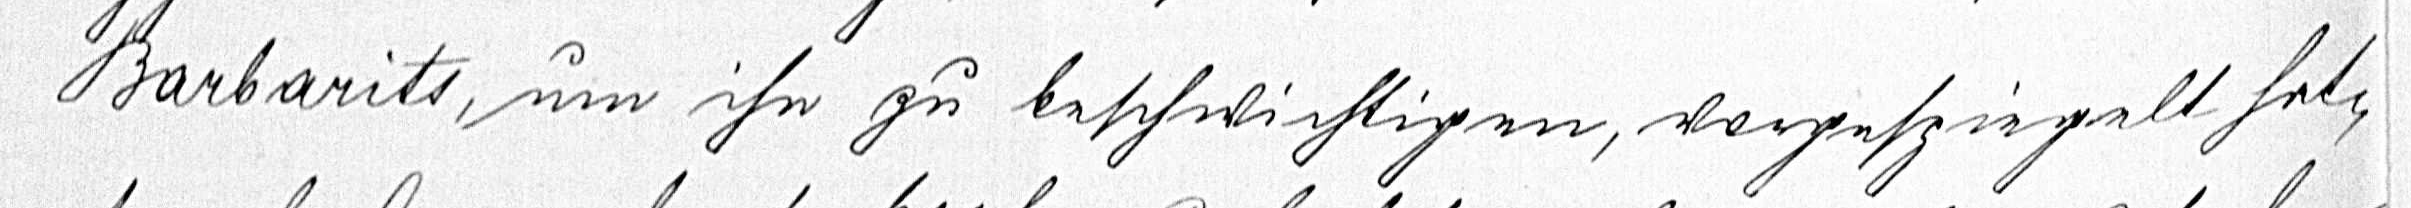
Barbarits, um ihn zu beschwichtigen, vorgespiegelt hat¬
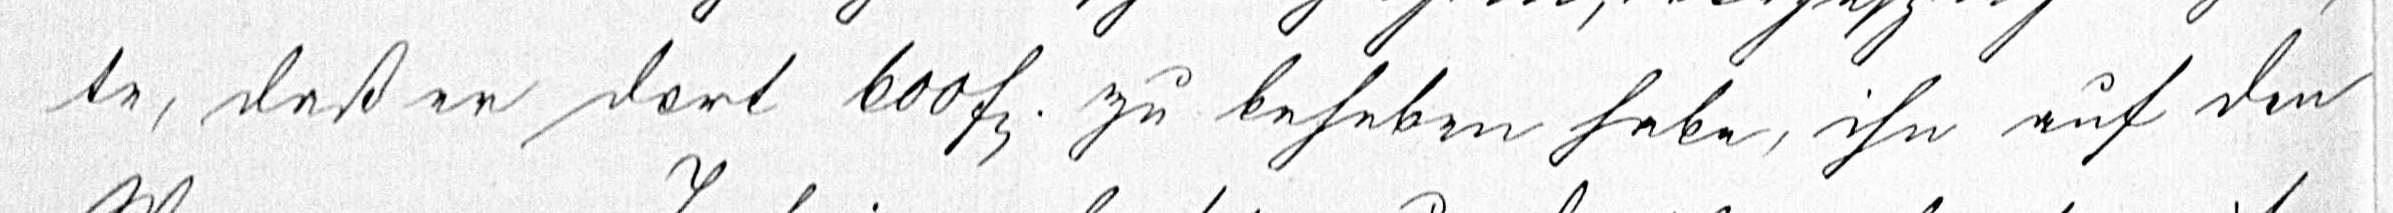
te, daß er dort 600 f. zu beheben habe, ihn auf den
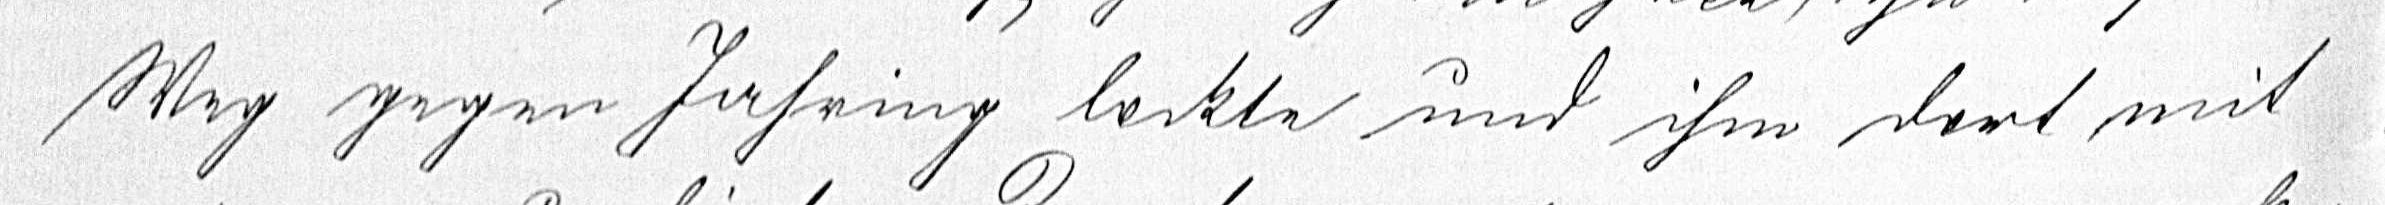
Weg gegen Jahring lockte und ihm dort mit
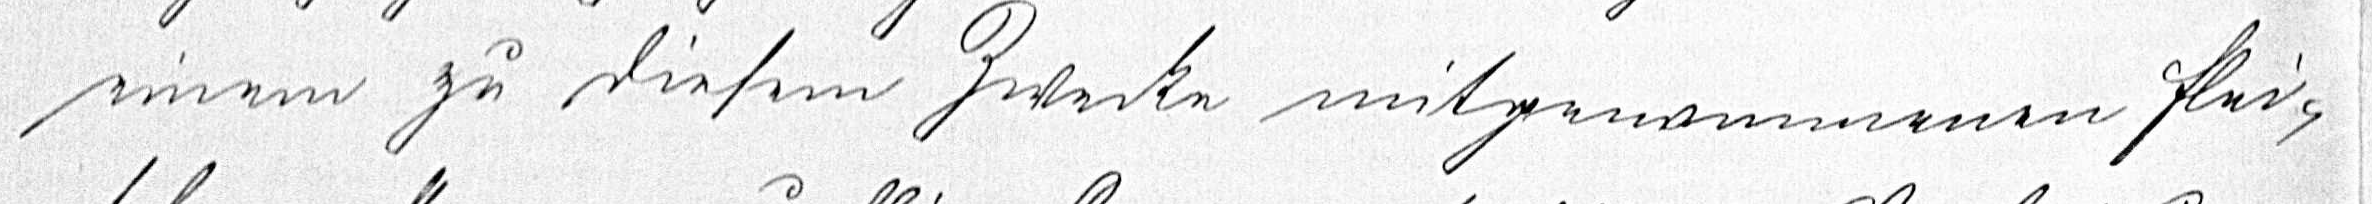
einem zu diesem Zwecke mitgenommenen Flei¬
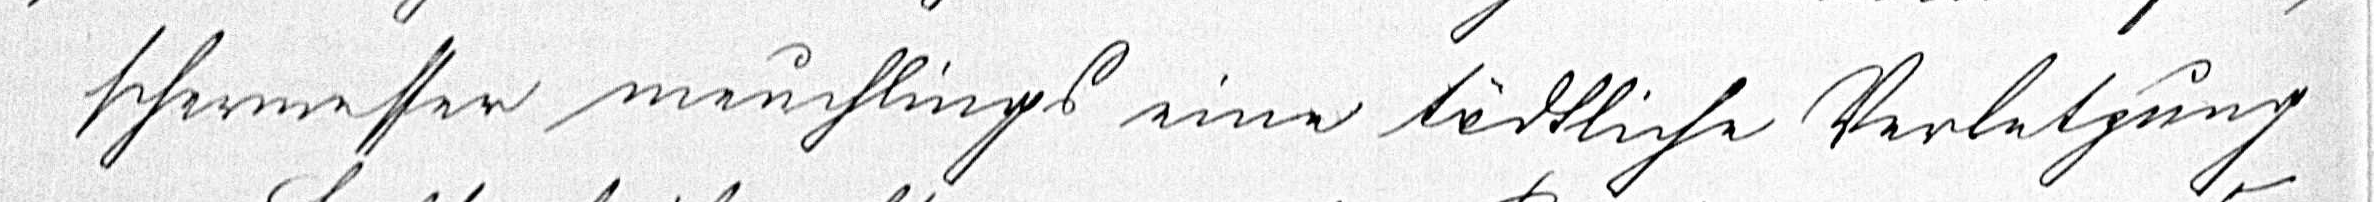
schermesser meuchlings eine tödliche Verletzung
